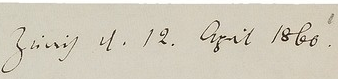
Zürich d. 12. April 1860.
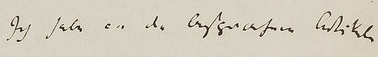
Ich habe an den besprochnen Artikeln
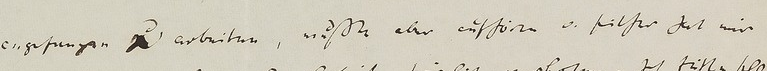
angefangen zu arbeiten, mußte aber aufhören &. seither hat mir
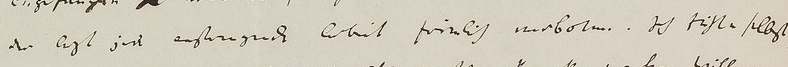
der Arzt jede anstrengende Arbeit förmlich verboten. Ich fühle selbst,
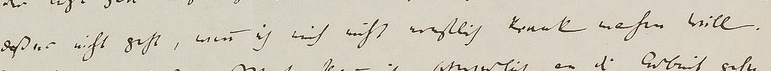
daß es nicht geht, wenn ich mich nicht ernstlich krank machen will.
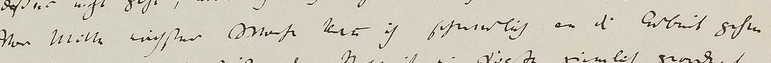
Vor Mitte nächster Woche kann ich schwerlich an die Arbeit gehen.
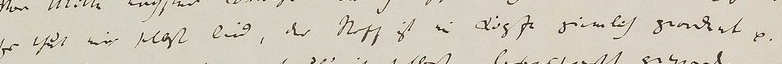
Es thut mir selbst leid, der Stoff ist im Kopfe ziemlich geordnet &.
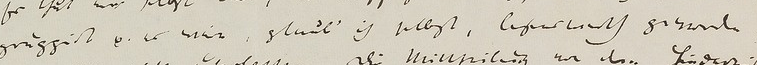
gruppirt &. es wäre, glaub' ich selbst, lesenswerth geworden.
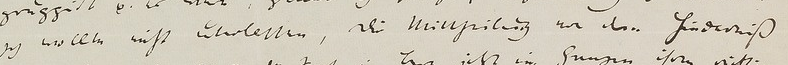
Ich wollte nicht unterlassen, Dir Mittheilung von dem Hinderniß
